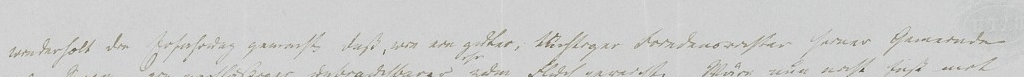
wiederholt die Erfahrung gemacht daß, wie ein guter, tüchtiger Friedensrichter seiner Gemeinde
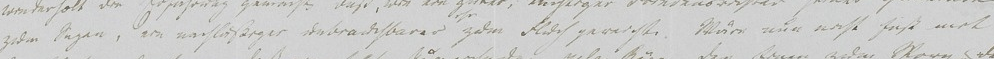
zum Segen, ein nachläßiger unbrauchbarer eher zum Fluch gereichte. Wäre nun nicht fast mit
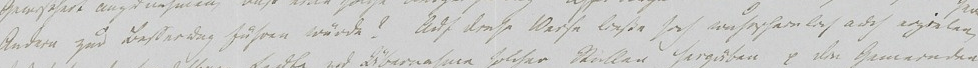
Andern zur Besserung führen würde? Auf diese Weise ließe sich wahrscheinlich auch erzielen,
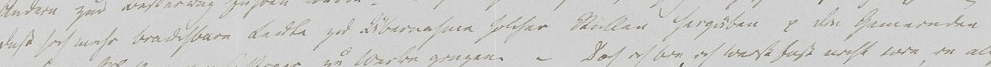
daß sich mehr brauchbare Leute zu Übernahme solcher Stellen hergäben & die Gemeinden
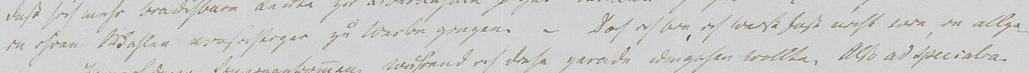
in ihren Wahlen vorsichtiger zu Werke gingen. – Doch ich bin, ich weiß fast nicht wie, in allge-
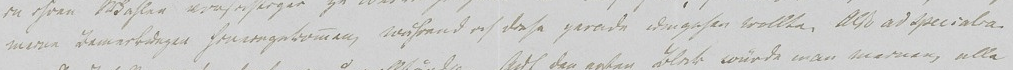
meine Bemerkungen hineingekommen, während ich diese gerade umgehen wollte. Also ad specialia.
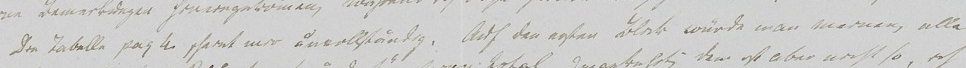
Die Tabelle pag 4. scheint mir unvollständig. Auf den ersten Blick würde man meinen, alle
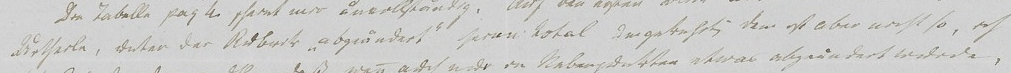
Urtheile, unter der Rubrik «abgeändert» seien total umgekehrt; dem ist aber nicht so, ich
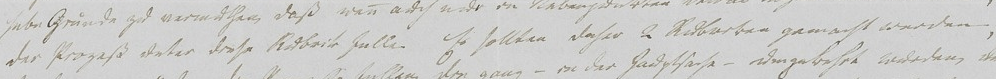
der Prozeß unter diese Rubrik falle. Es sollten daher 2 Rubriken gemacht werden,
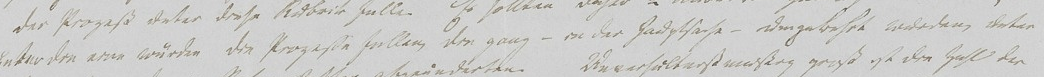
unter die eine würden die Prozesse fallen, die ganz – in der Hauptsache – umgekehrt wurden, unter
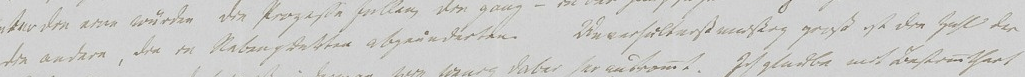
die andere, die in Nebenpunkten abgeänderten. Unverhältnißmäßig groß ist die Zahl der
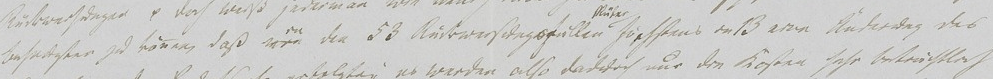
behaupten zu können, daß in den 53 Rückweisungsfällen später höchstens in 13 eine Änderung des
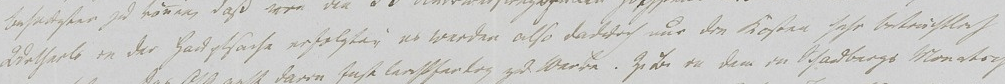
Urtheils in der Hauptsache erfolgte; es werden also dadurch nur die Kosten sehr beträchtlich
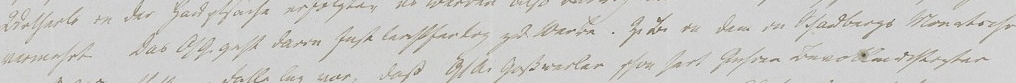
vermehrt. Das O.G. geht darin fast leichtfertig zu Werke. z. B. in dem in Schaubergs Monatschr
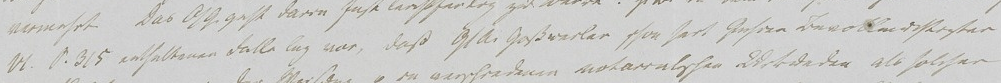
VI S. 315 enthaltenen Falle lag vor, daß G.A. Goßweiler schon seit Jahren Bevollmächtigter
